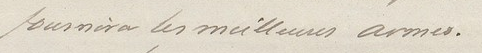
fournira les meilleures armes.
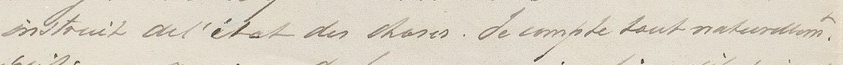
instruit de l'état des choses. Je compte tout naturellemt
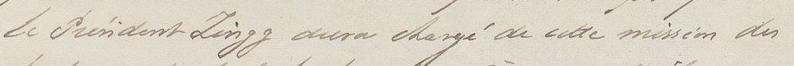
le Président Zingg aura chargé de cette mission des
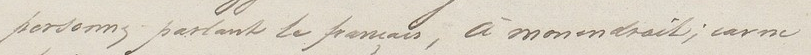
personnes parlant le français, à mon endroit; car ne
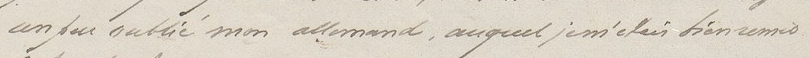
un peu oublié mon allemand, auquel je m'etais bien remis
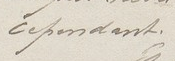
cependant.
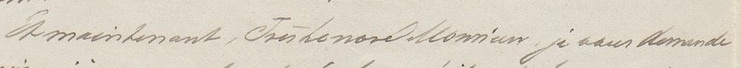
Et maintenant, Très honoré Monsieur, je vous demande
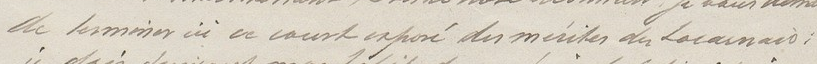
de terminer ici ce court exposé des mérites des Locarnais;
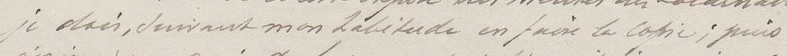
je dois, suivant mon habitude en faire la copie; puis
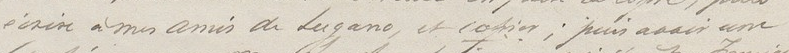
écrire à mes amis de Lugano, et copier; puis avoir une
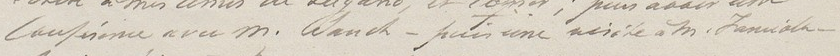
Conférence avec M. Jauch – puis une visite à M. Fanciola –
